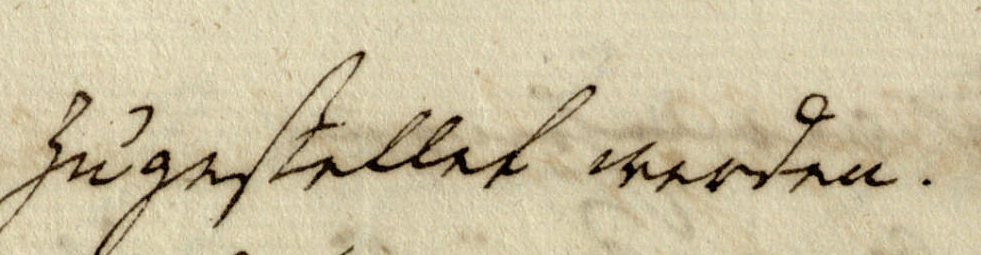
zugestellet werden.
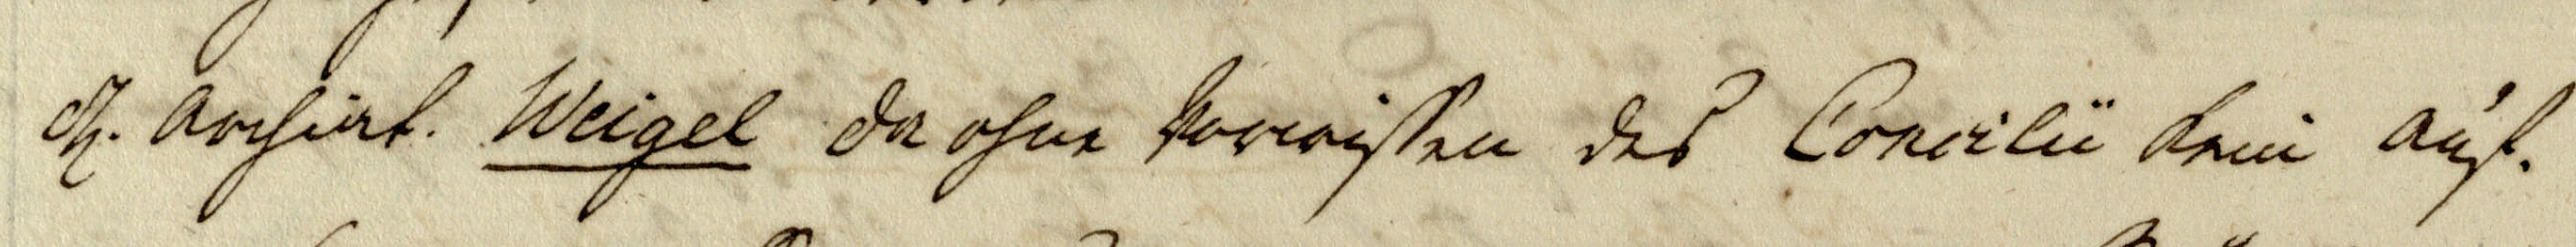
dh. Archiat. Weigel Da ohne Vorwissen des Concilii kein Auf¬
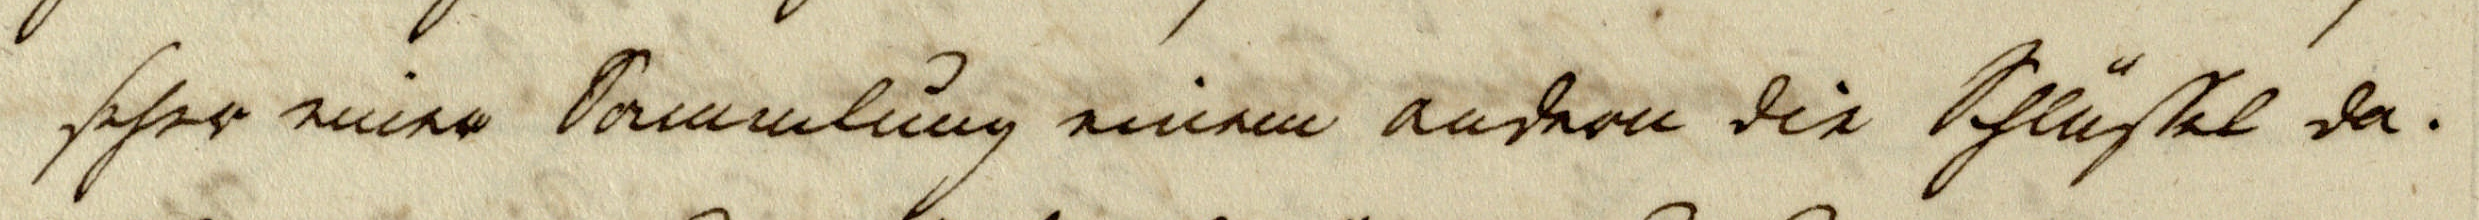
sicher einer Sammlung einem andern die Schlüssel da¬
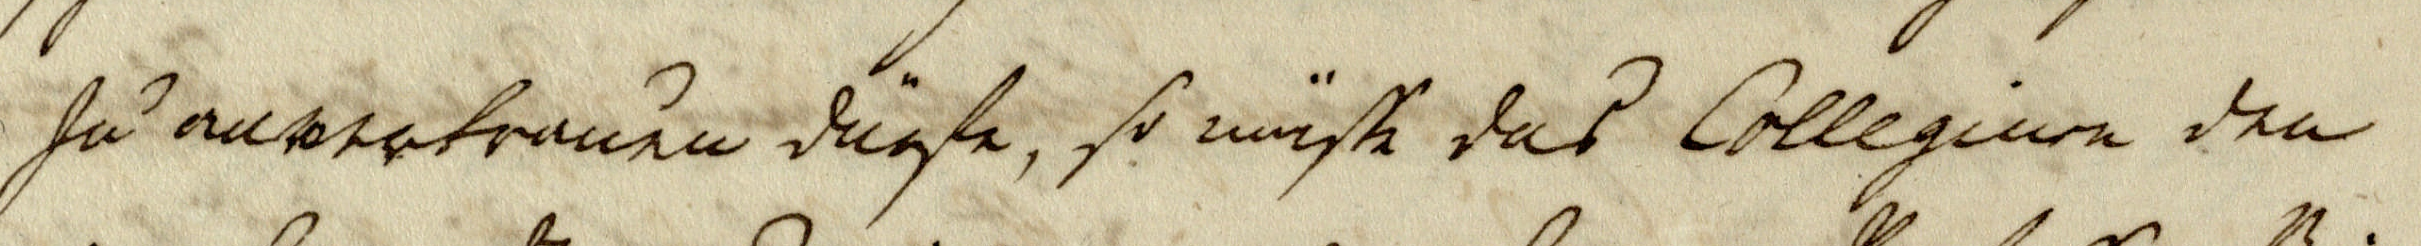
zu anvertrauen dürfe, so müsse das Collegium den
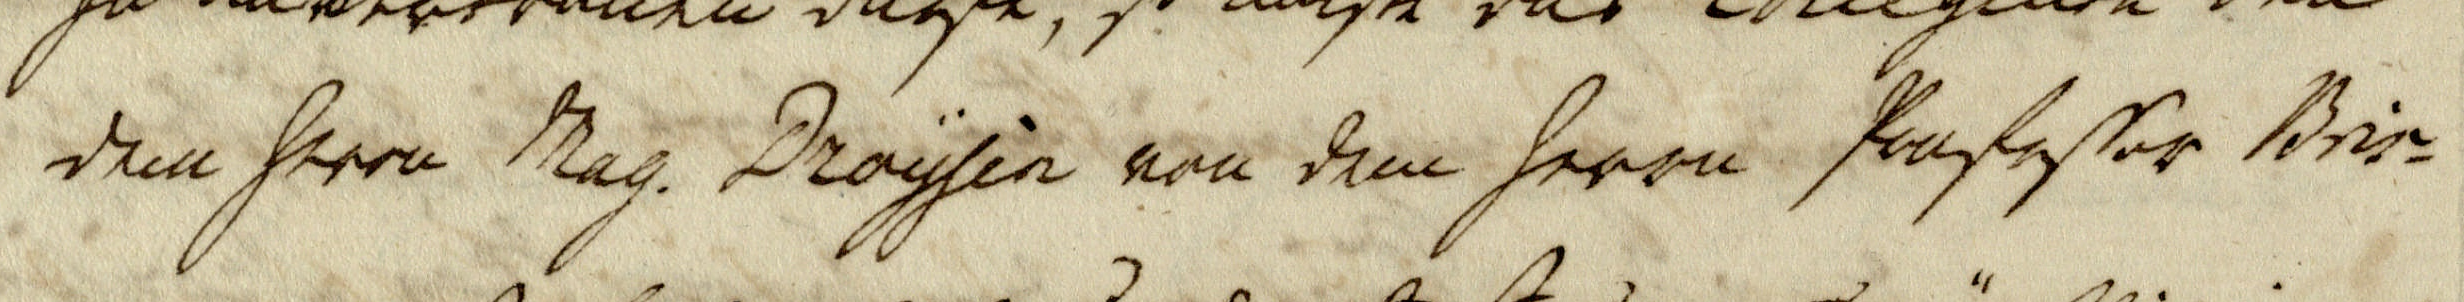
dem Herrn Mag. Droÿsen von dem Herrn Professor Bris¬
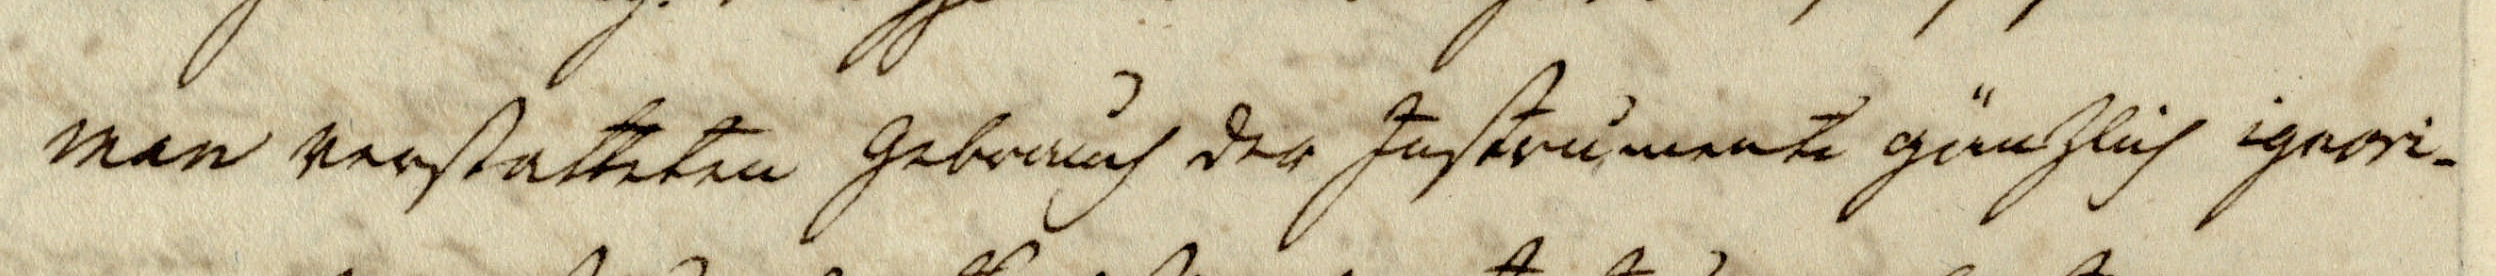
man verstatteten Gebrauch der Instrumente gänzlich ignori¬
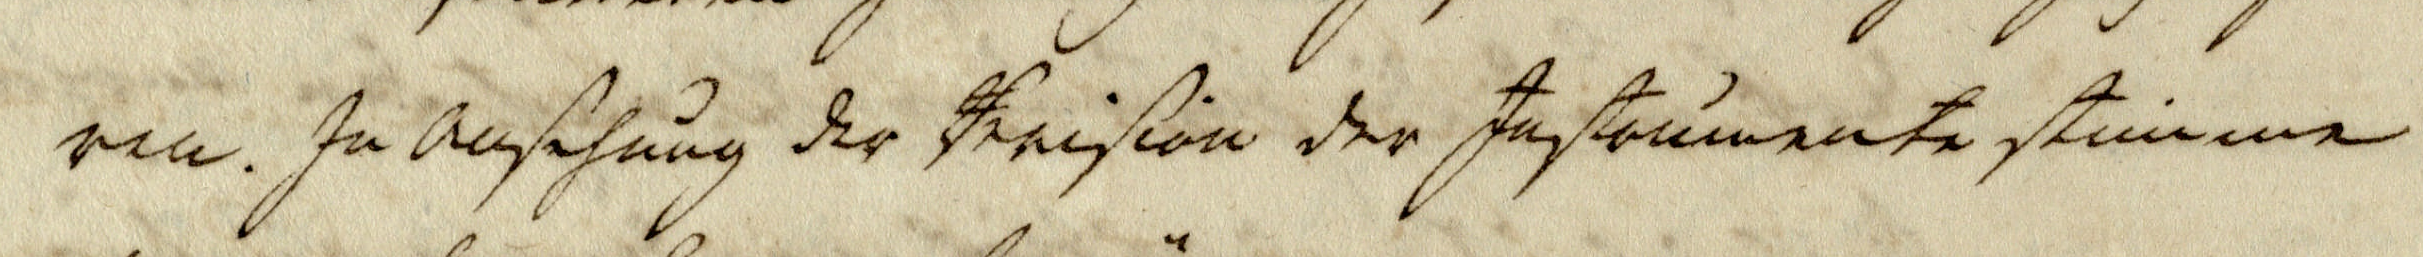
ren. In Ansehung der Revision der Instrumente stimme
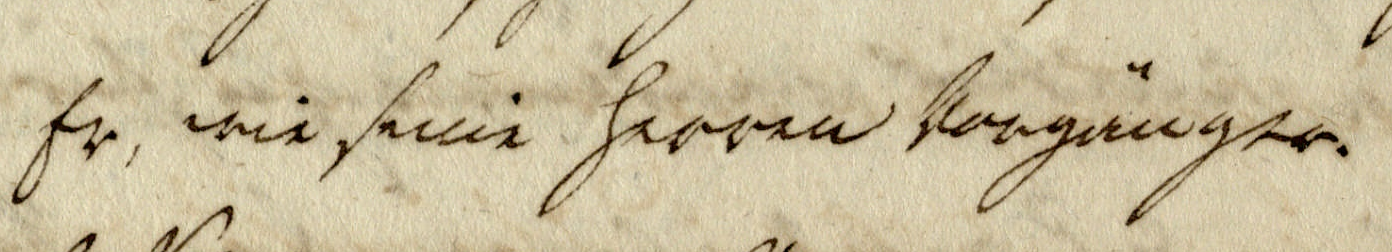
Er, wie seine Herren Vorgänger.
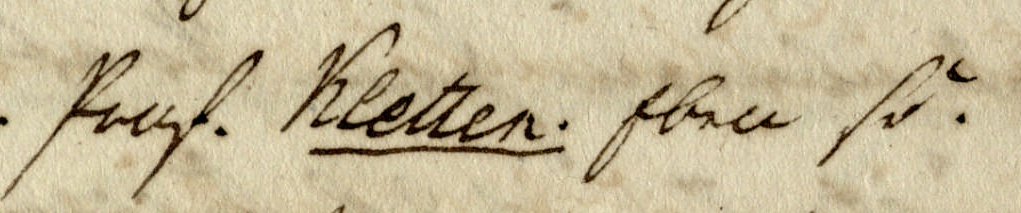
Prof. Kletten. Eben so.
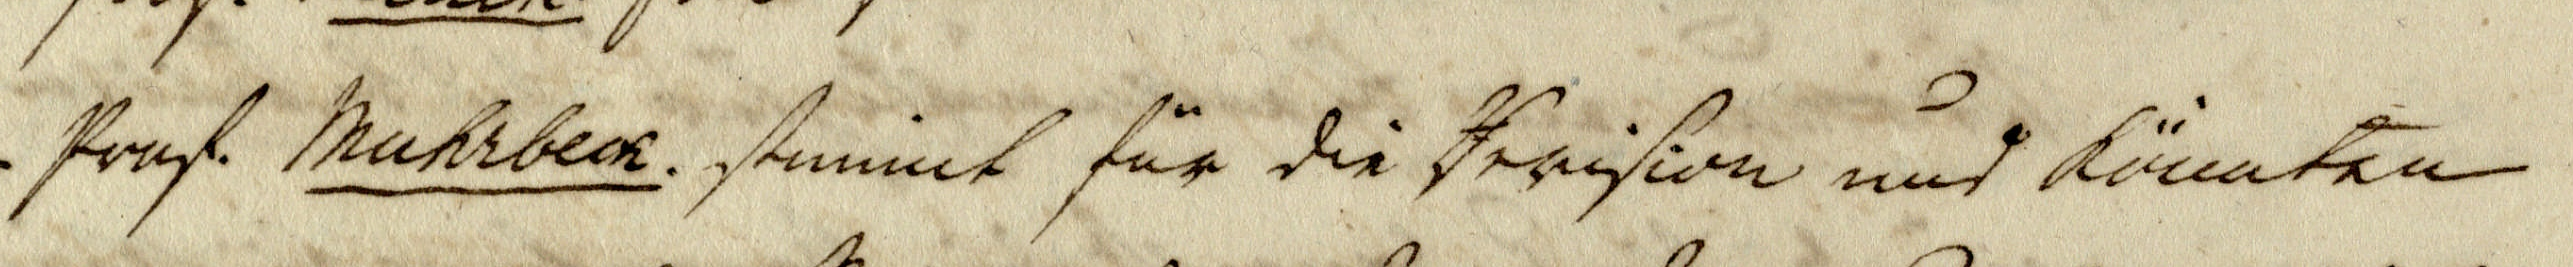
Prof. Muhrbeck. stimmt für die Revision und könnten
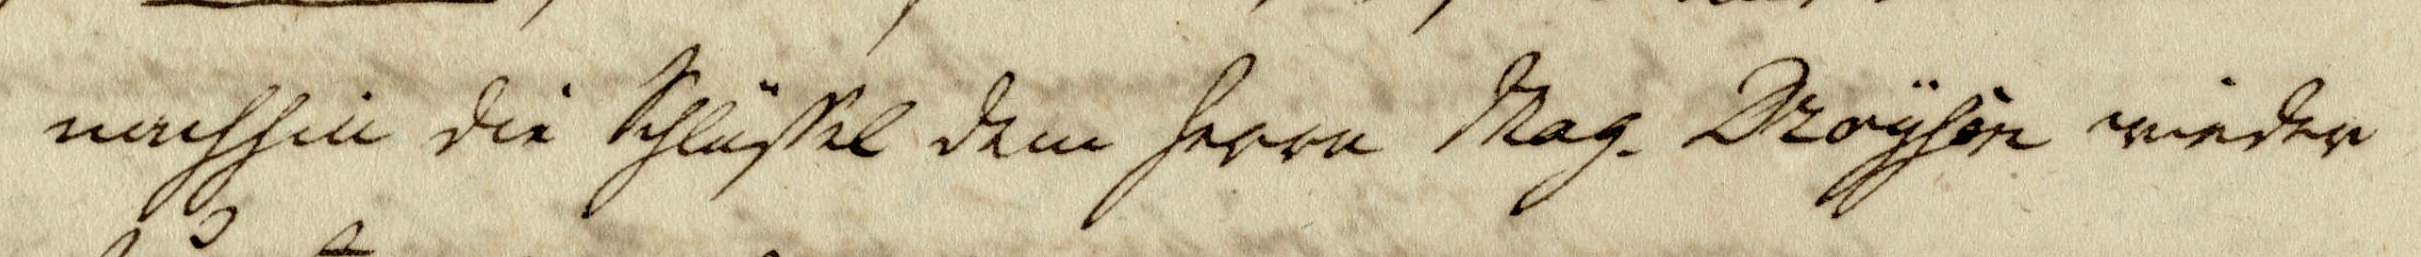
nachhin die Schüssel dem Herrn Mag. Droÿsen wieder
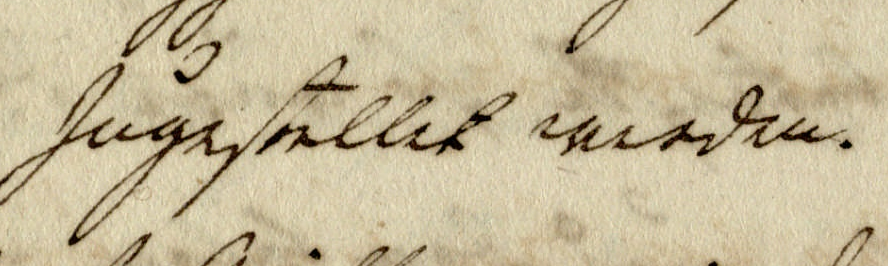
zugestellet werden.
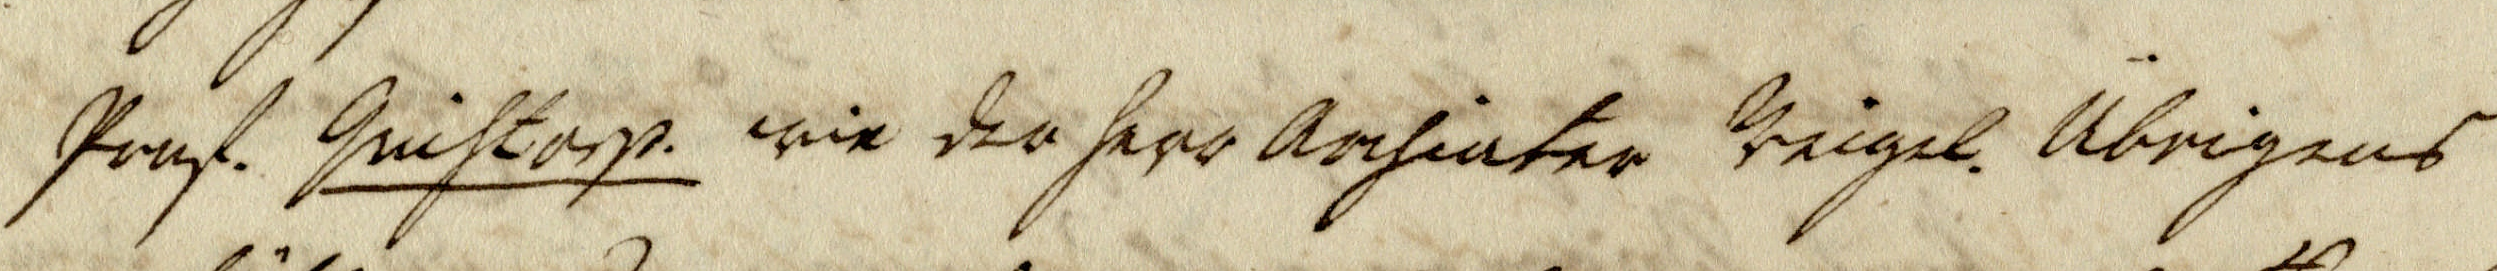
Prof. Quistorp. wie der Herr Archiater Weigel. Übrigens
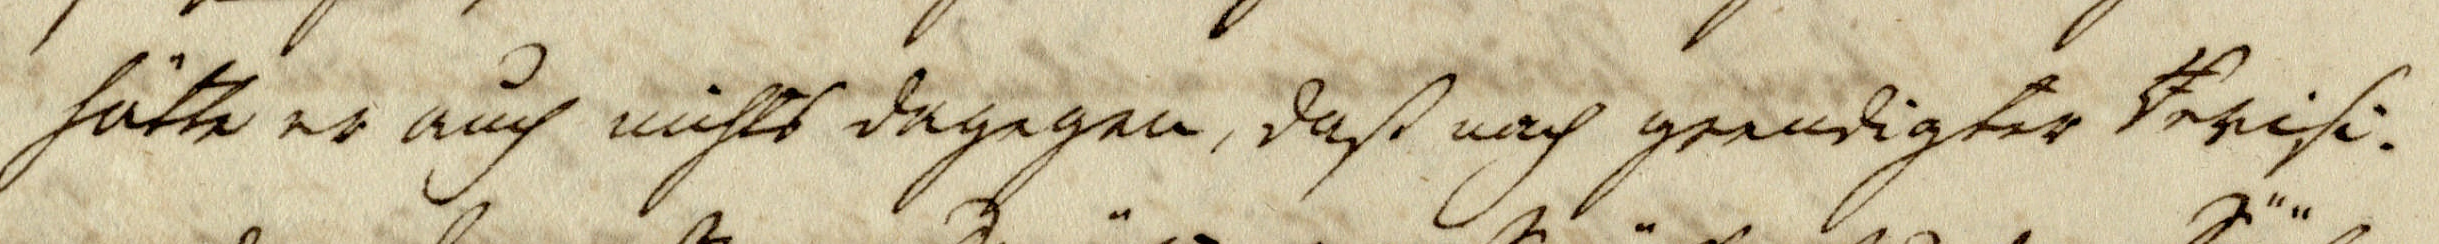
hätte er auch nichts dagegen, daß nach geendigter Revisi¬
